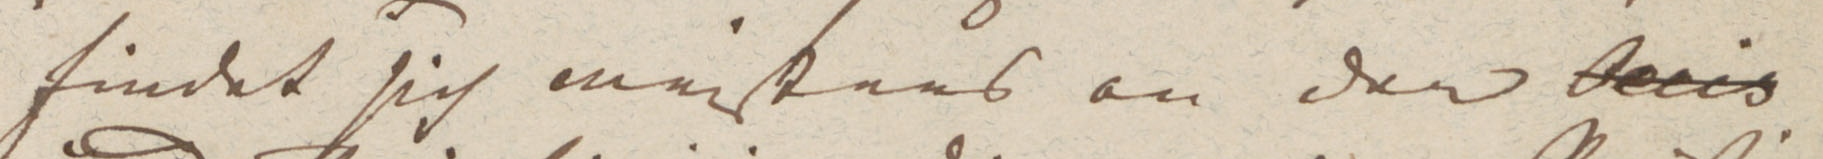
findet sich meistens an den Oecis
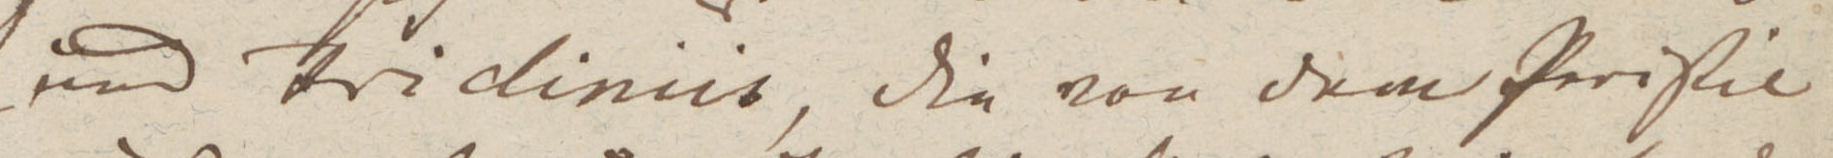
und tricliniis, die von dem Peristil
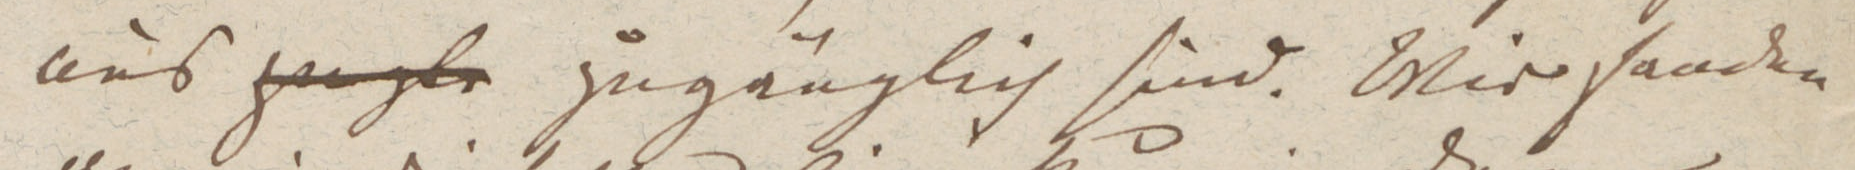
aus zugl zugänglich sind. Wir fanden
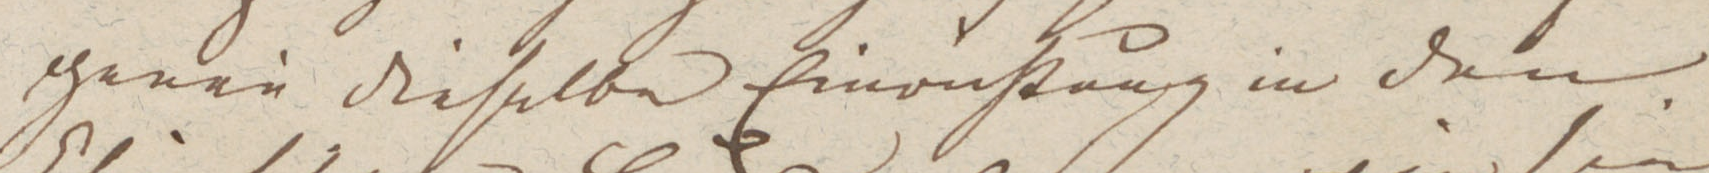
genau dieselbe Einrichtung in den
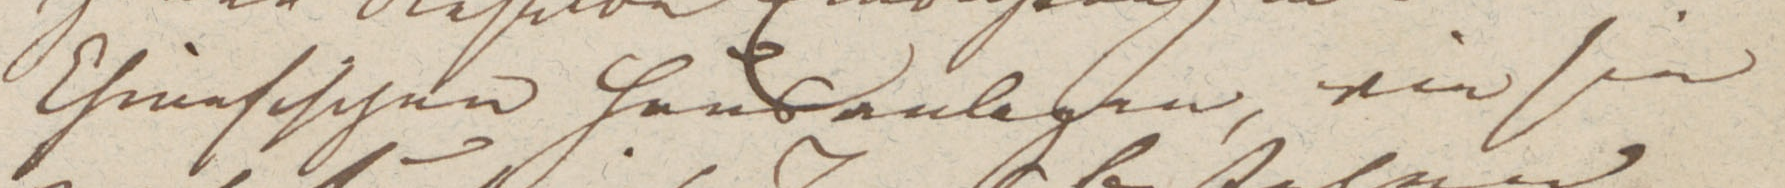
Chinesischen Hausanlagen, wie sie
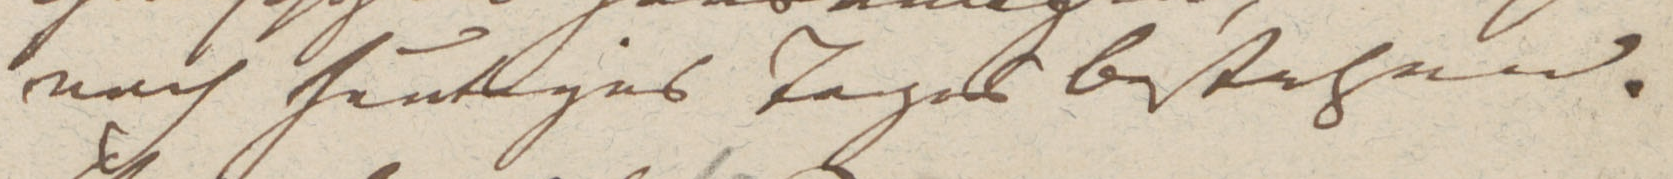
noch heutiges Tages bestehen.
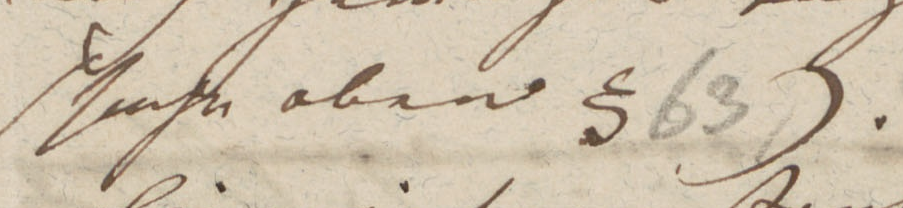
(siehe oben § 63).
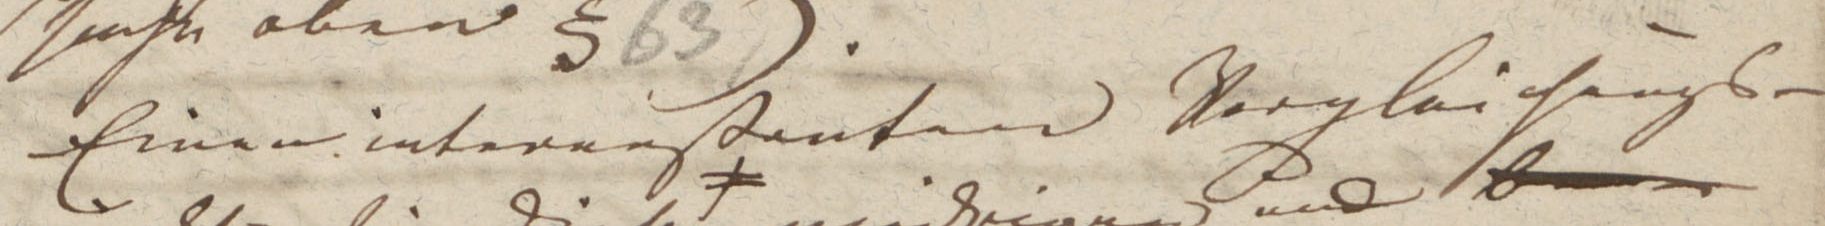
Einen interessanten Vergleichungs-
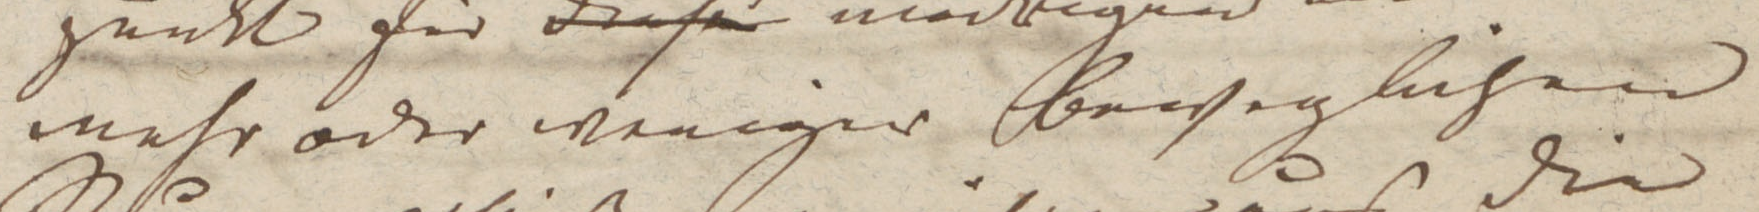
mehr oder weniger beweglichen
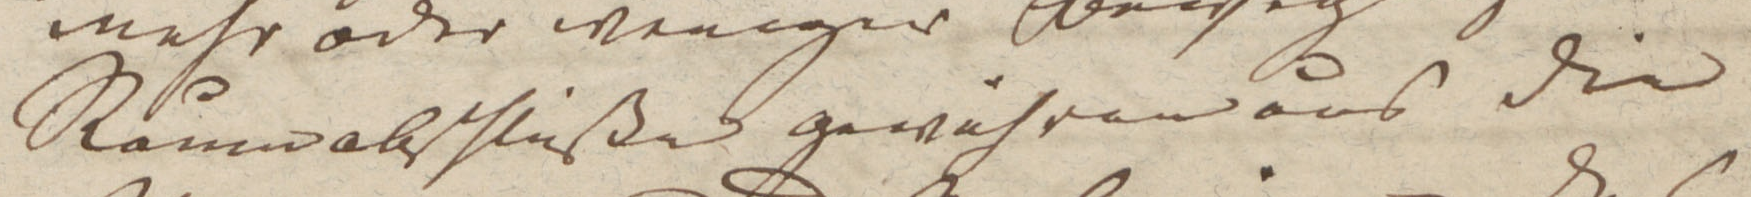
Raumabschlüsse gewähren uns die
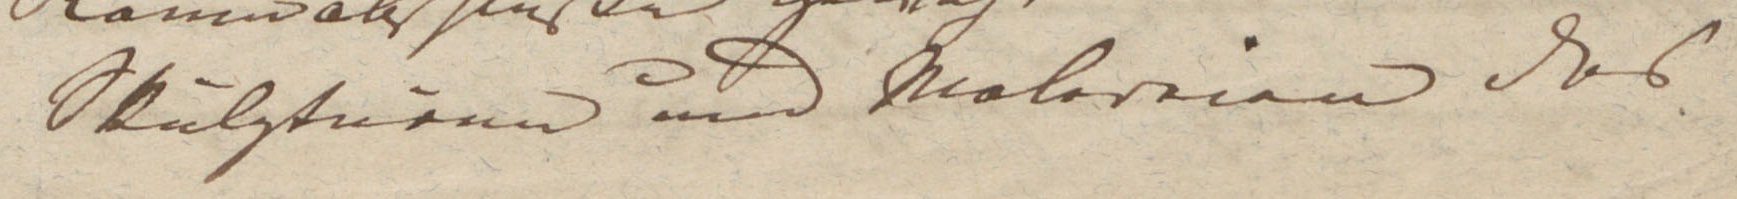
Skulpturen und Malereien des
